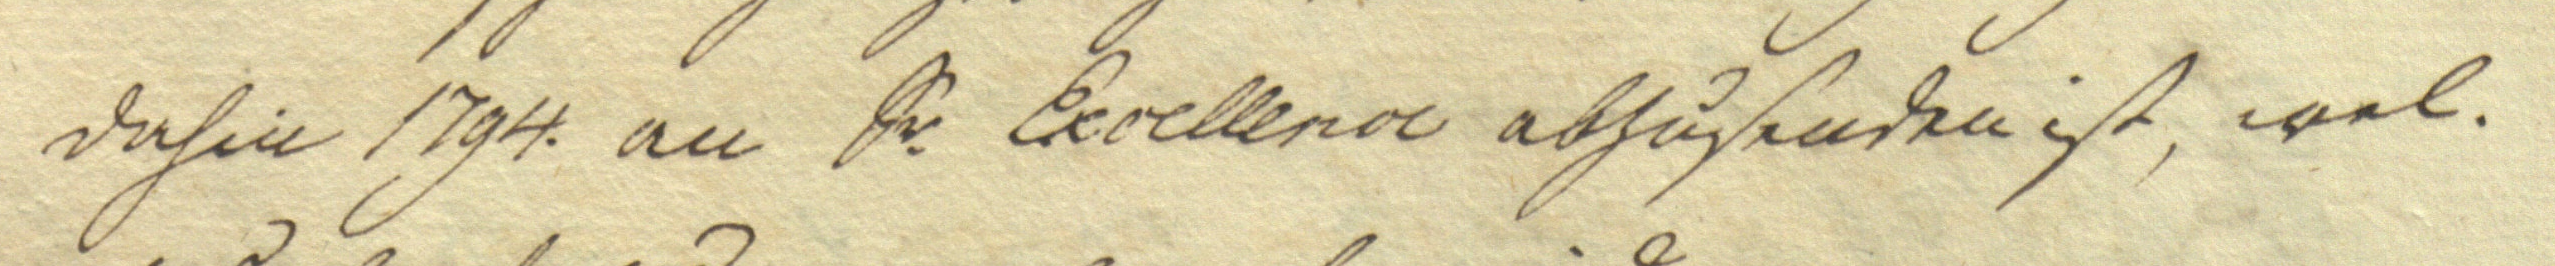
dahin 1794. an Sr. Excellence abzusenden ist, wel¬
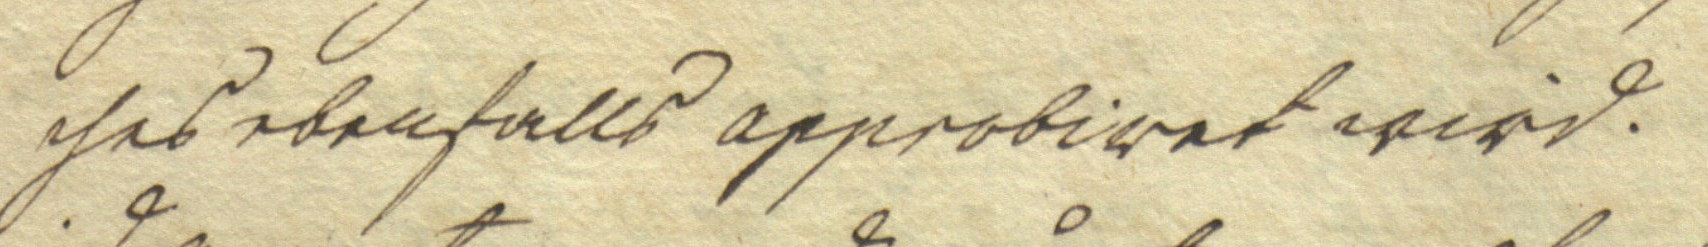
ches ebenfalls approbiret wird.
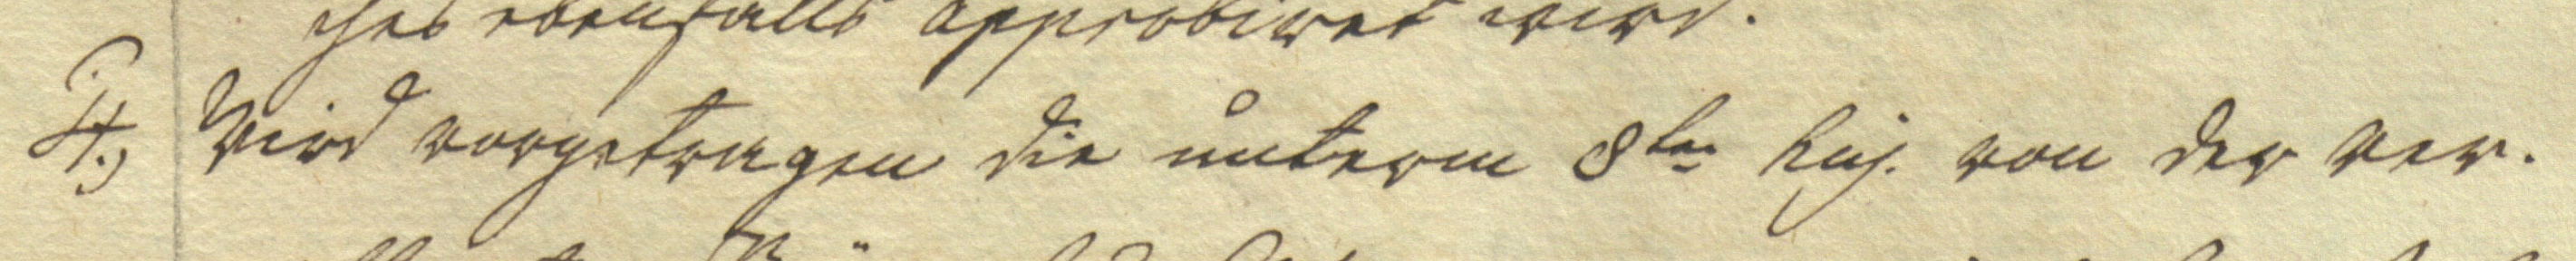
4., Wird vorgetragen die unterm 8 te huj. von der ver¬
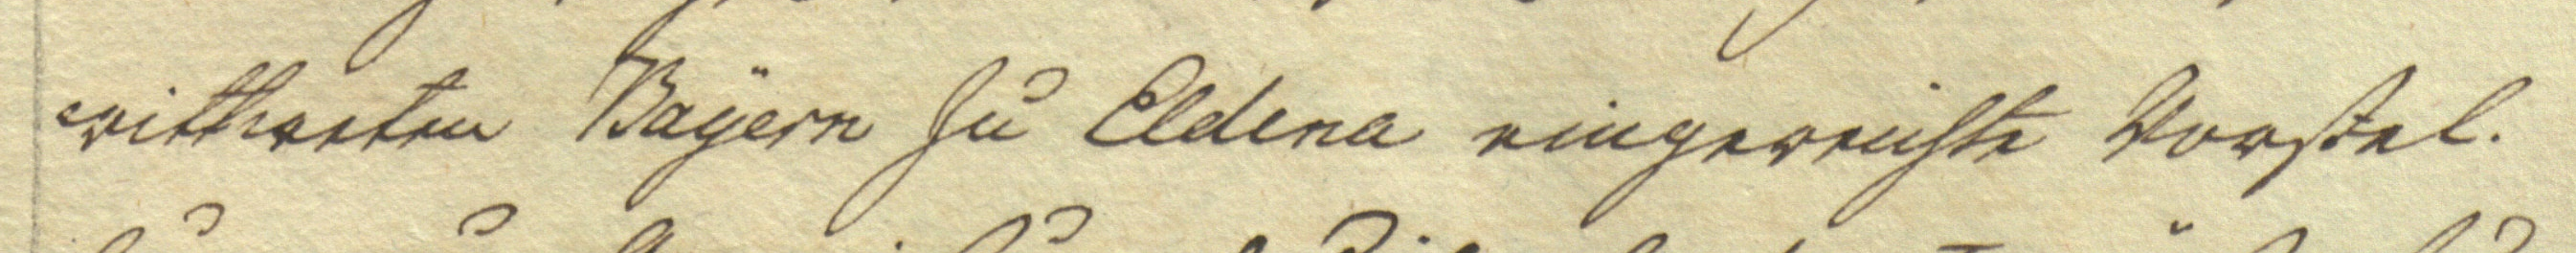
wittweten Baÿern zu Eldena eingereichte Vorstel¬
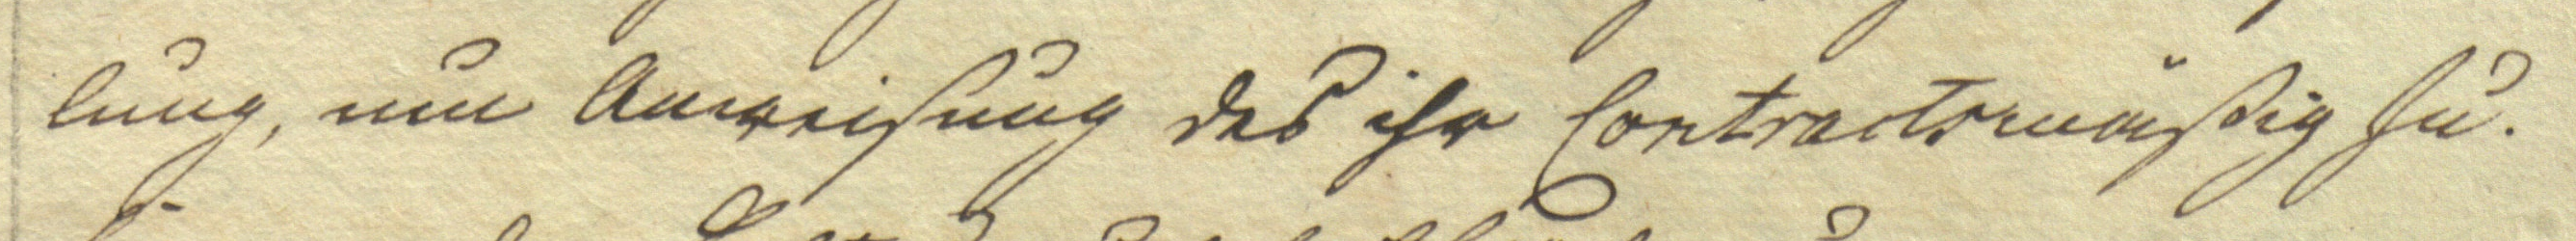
lung, um Anweisung des ihr Contractsmäßig zu¬
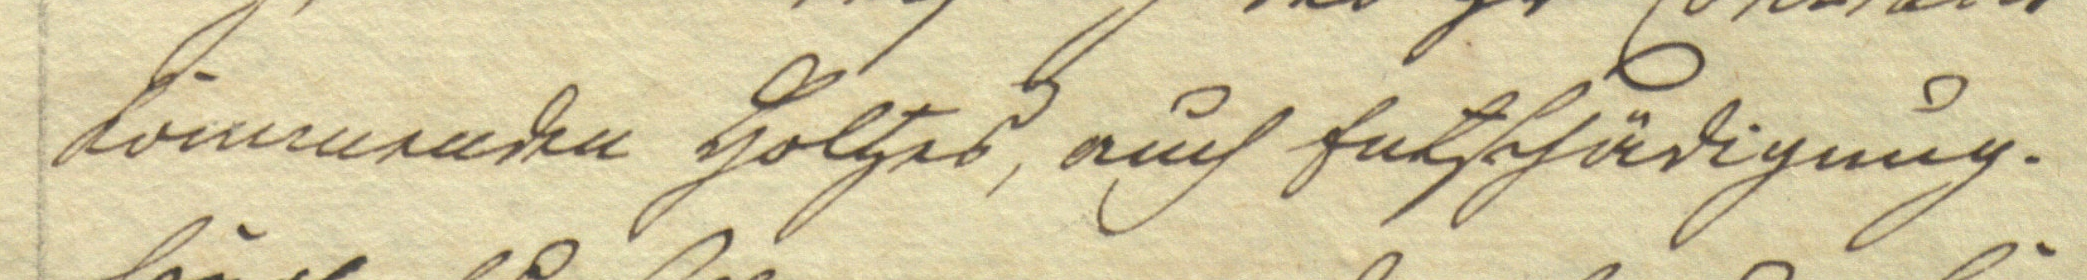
kommenden Holtzes, auch Entschädigung.
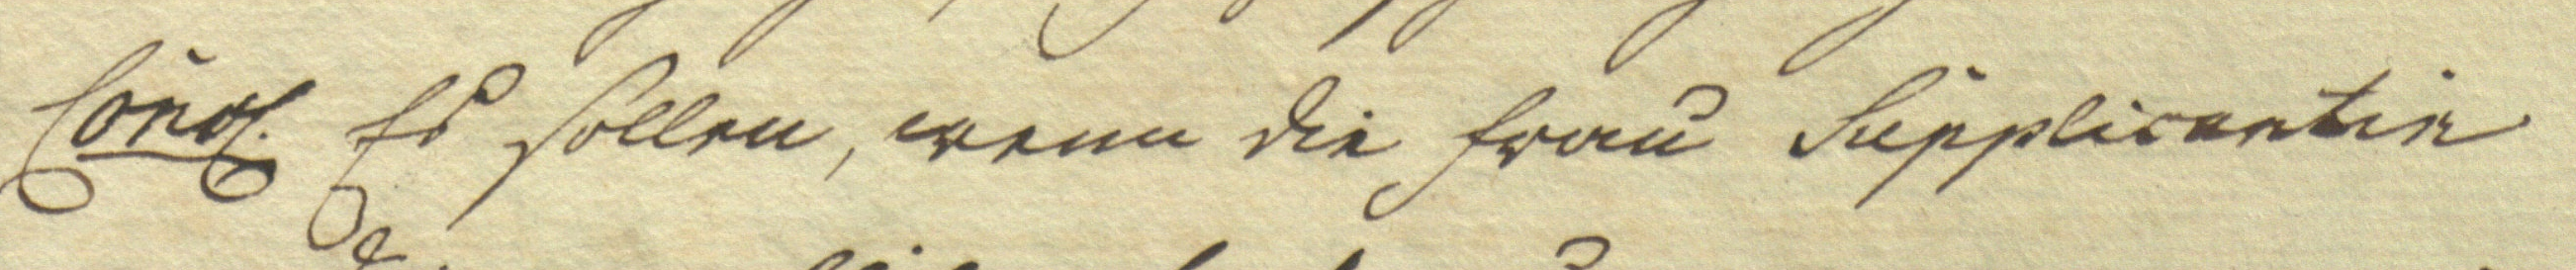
Concl. Es sollen, wenn die Frau Supplicantin
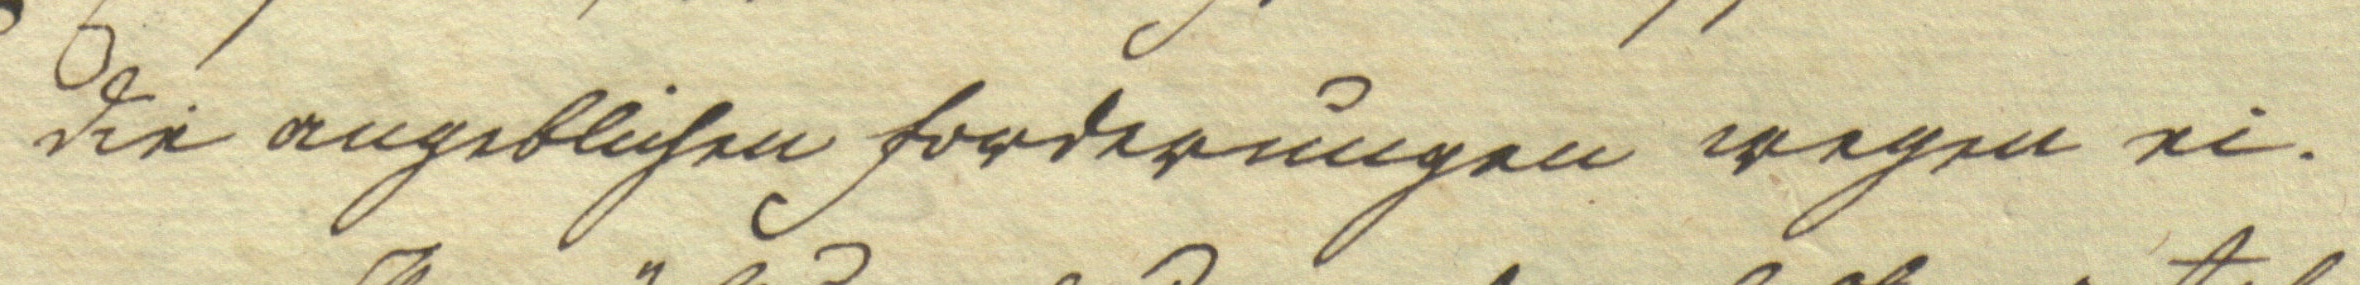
die angeblichen Forderungen wegen ei¬
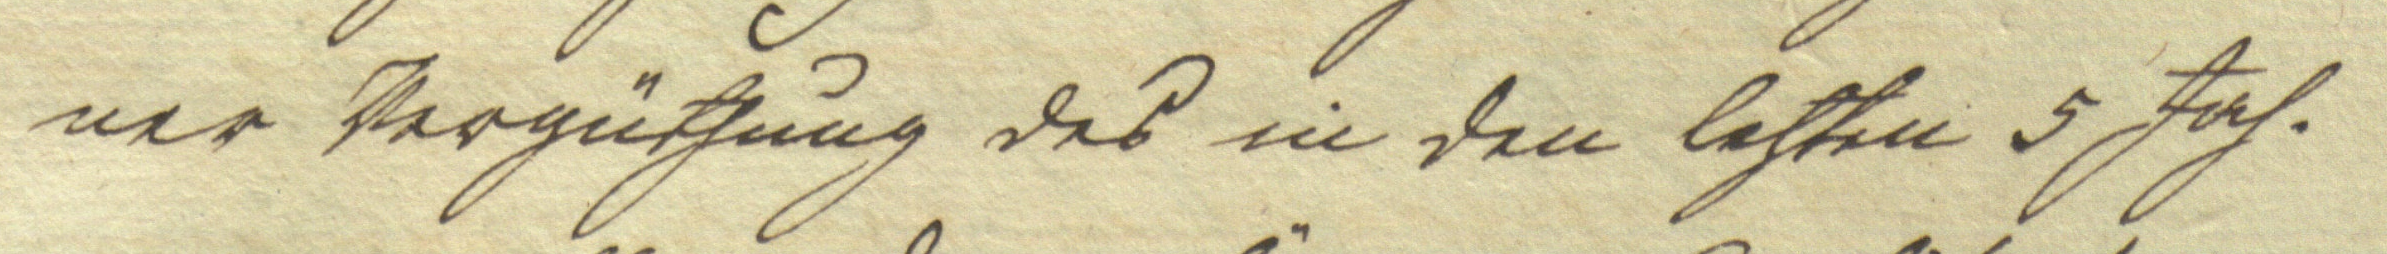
ner Vergüthung des in den letzten 5 Jah¬
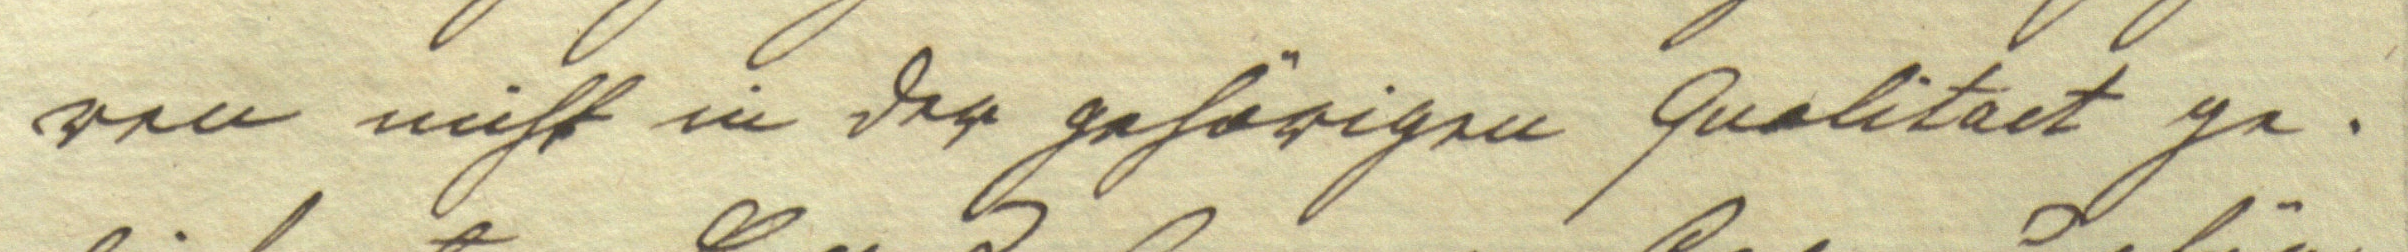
ren nicht in der gehörigen Qualitaet ge¬
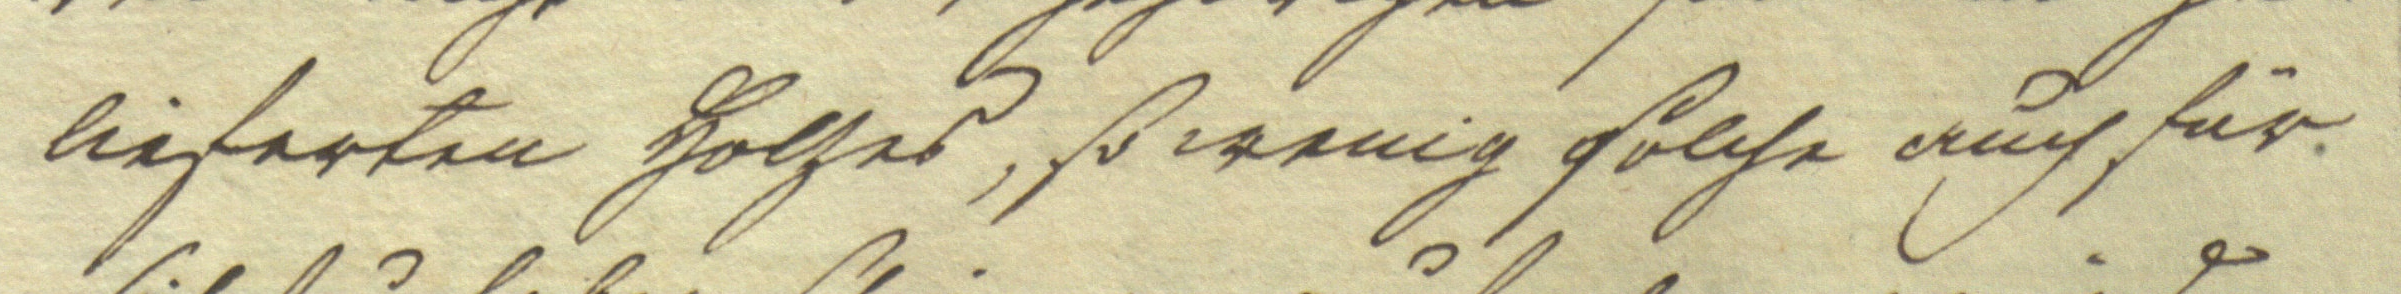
lieferten Holzes, so wenig solche auch für
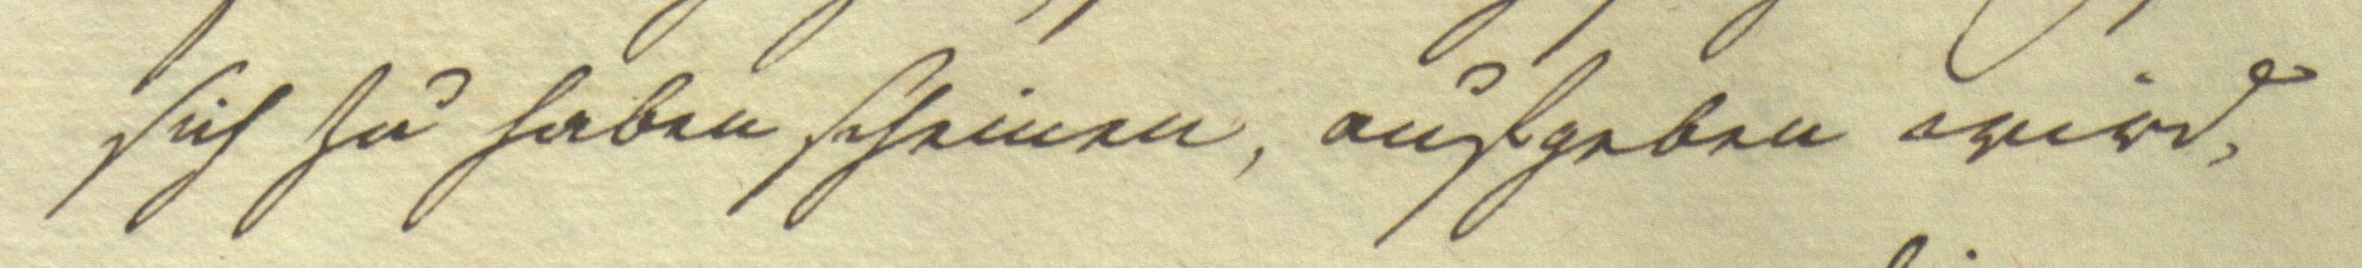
sich zu haben scheinen, aufgeben wird,
